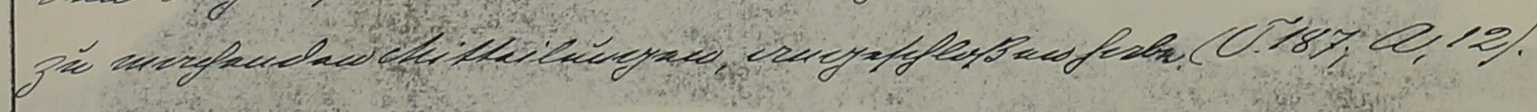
zu machenden Mitteilungen, angeschloßen habe. (T.187; A.12).
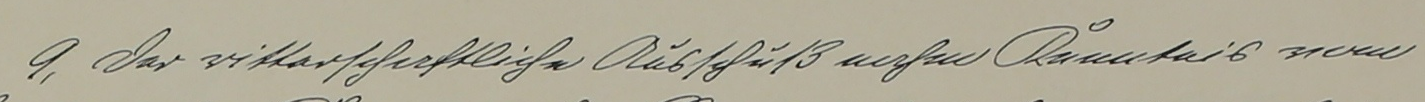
9. Der ritterschaftliche Ausschuß nahm Kenntnis vom
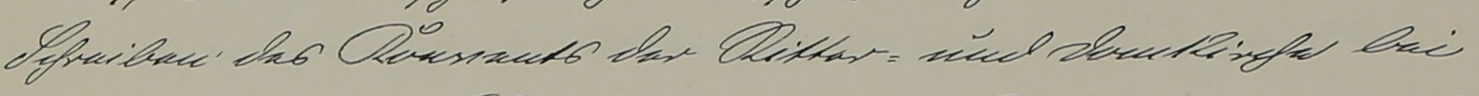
Schreiben des Konvents der Ritter- und Domkirche bei
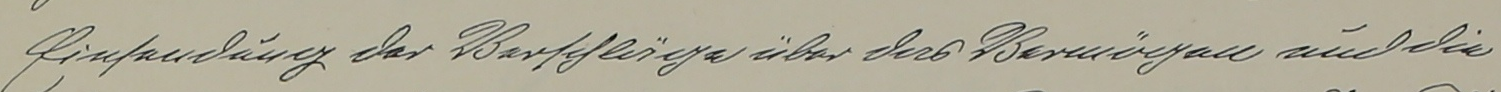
Einsendung der Vorschläge über das Vermögen und die
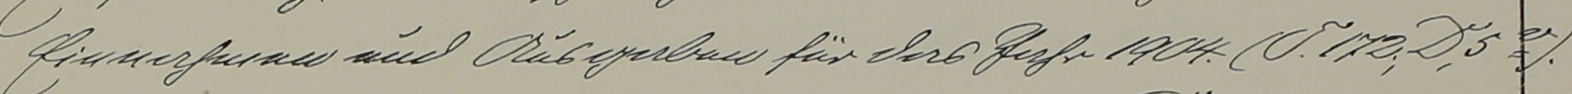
Einnahmen und Ausgaben für das Jahr 1904. (T.172; D.5v).
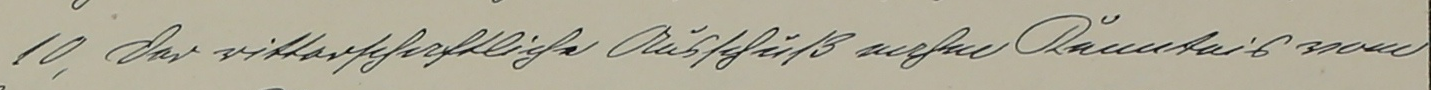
10. Der ritterschaftliche Ausschuß nahm Kenntnis vom
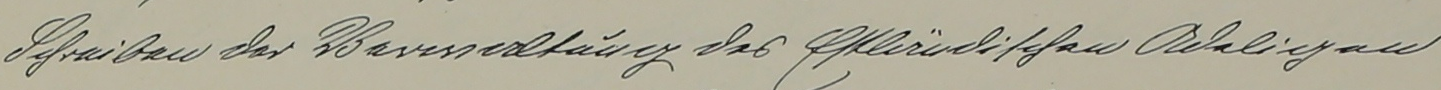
Schreiben der Verwaltung des Estländischen Adeligen
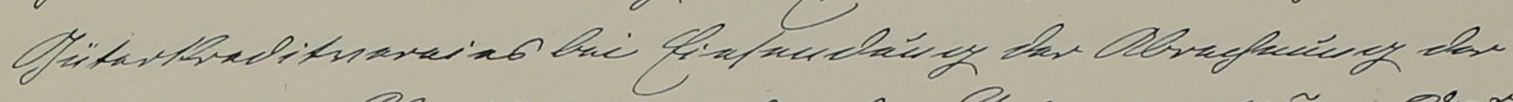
Güterkreditvereins bei Einsendung der Abrechnung der
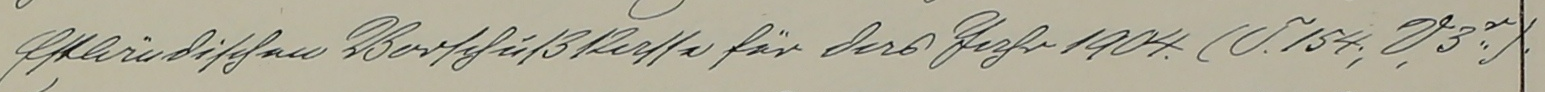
Estländischen Vorschußkasse für das Jahr 1904. (T.154; V.3r).
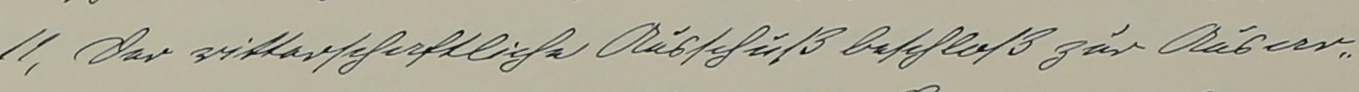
11. Der ritterschaftliche Ausschuß beschloß zur Ausar-
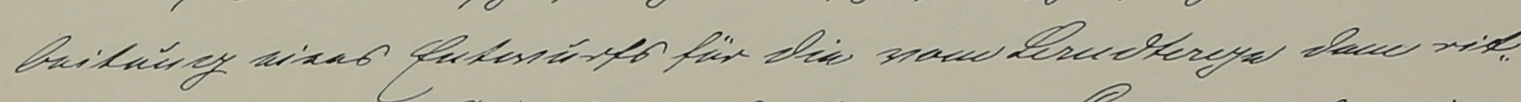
beitung eines Entwurfs für die vom Landtage dem rit-
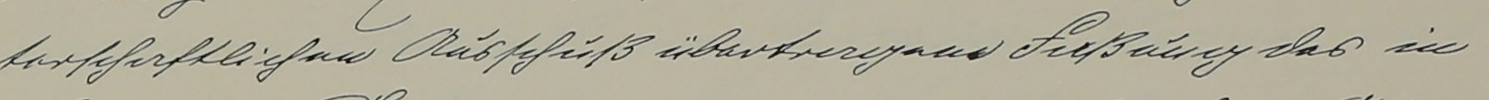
terschaftlichen Ausschuß übertragene Faßung des in
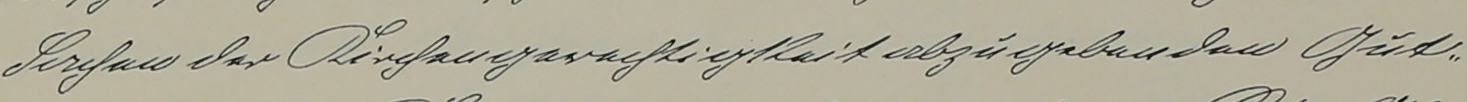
Sachen der Kirchengerechtigkeit abzugebenden Gut-
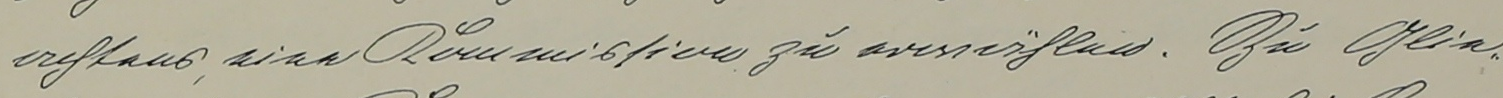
achtens, eine Kommission zu erwählen. Zu Glie-
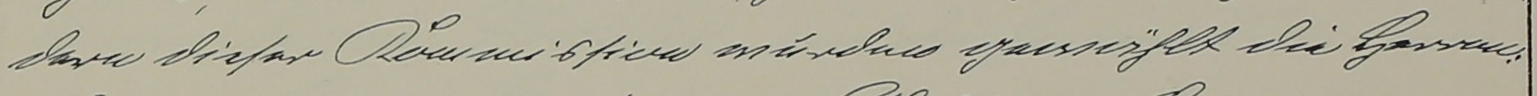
dern dieser Kommission wurden gewählt die Herren:
